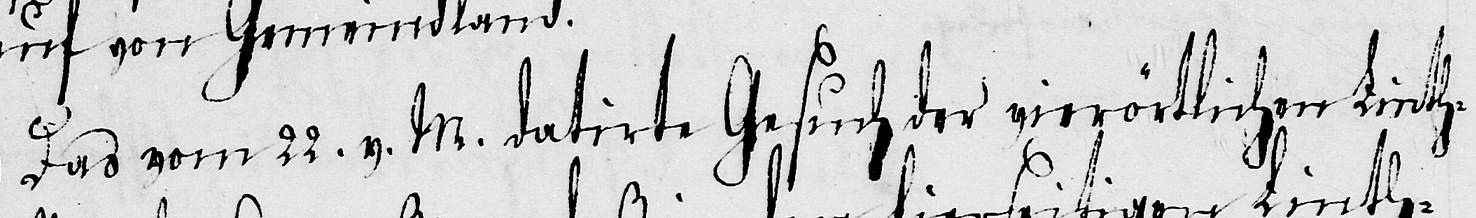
Das vom 22. v. M. datirte Gesuch der vierörtlichen Linth¬
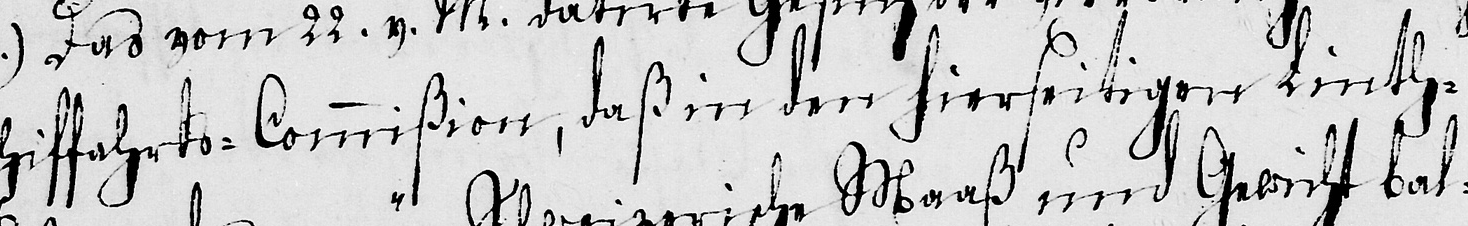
hiffahrts-Commißion, daß in den hierseitigen Linth¬
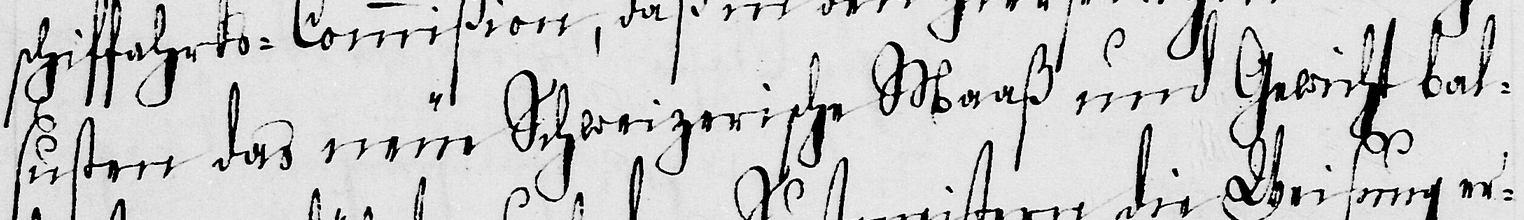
susten das neue Schweizerische Maaß und Gewicht bal¬
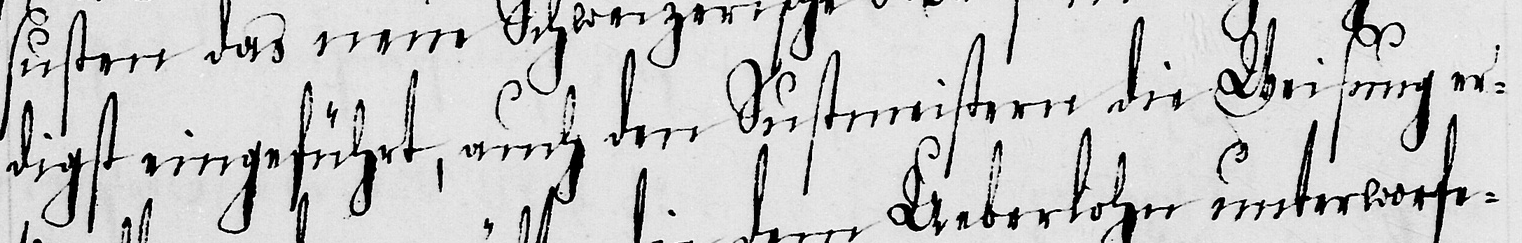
digst eingeführt, auch den Sustmeistern die Weisung er¬
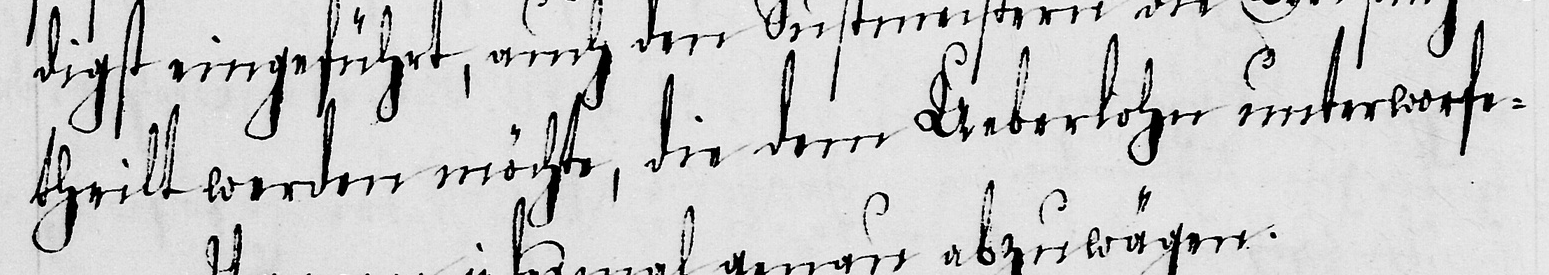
theilt werden möchte, die dem Ueberlohn unterworfe¬
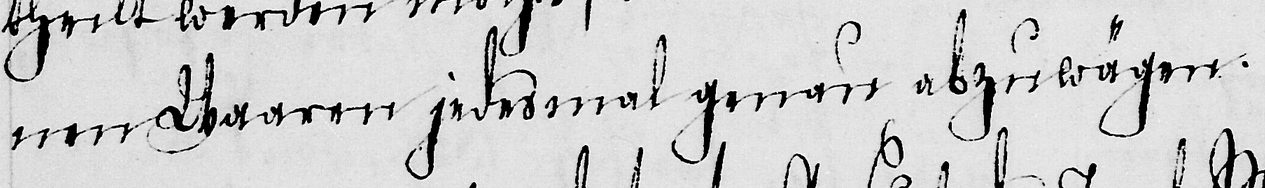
nen Waaren jedesmal genau abzuwägen.
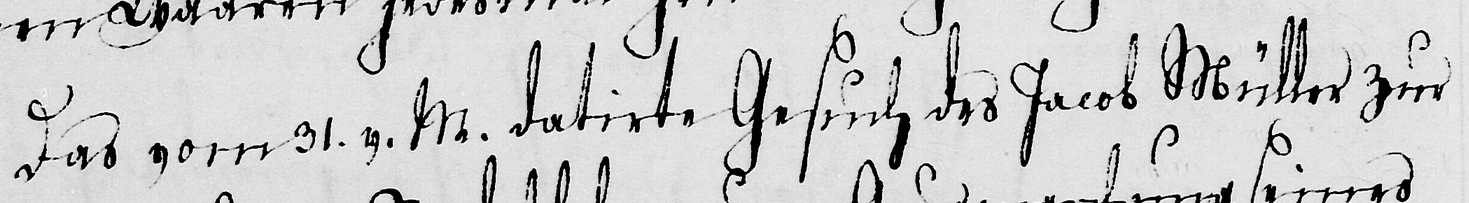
Das vom 31. v. M. datirte Gesuch des Jacob Müller zur
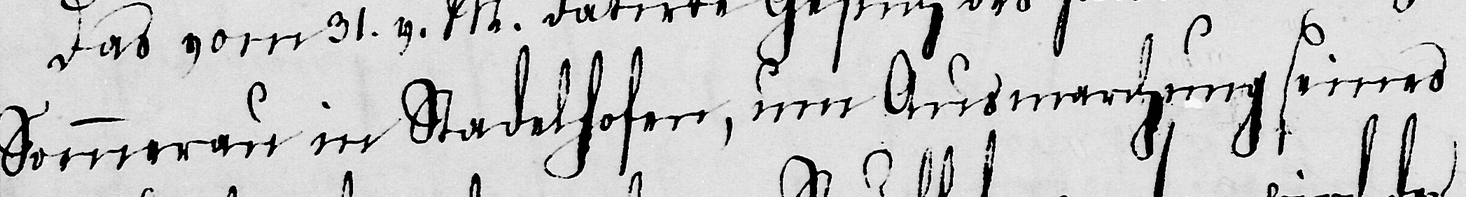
Sommerau in Stadelhofen, um Ausmarchung seines
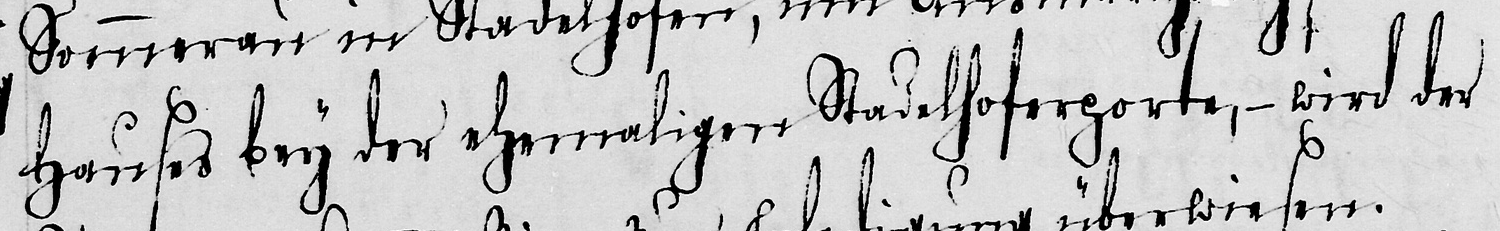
Hauses bey der ehemaligen Stadelhoferporte, – wird der
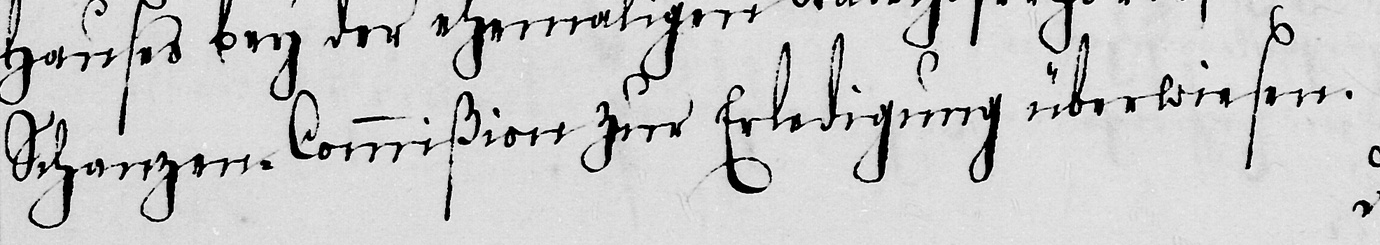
Schanzen-Commißion zur Erledigung überwiesen.
